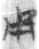用（甬）
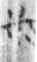必
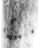㠯（以）
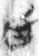爲
